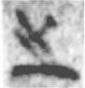之
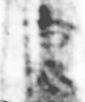黃
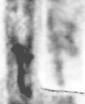建
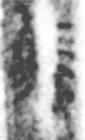馭（御）
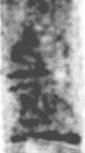墨
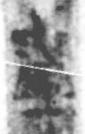𨍱（乘）
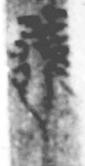騬
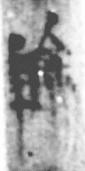輪
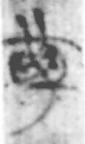革
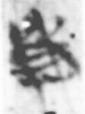兼
